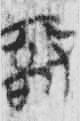敔
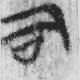司
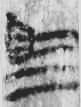馬
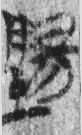○（陽）
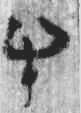牛
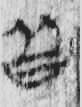皆
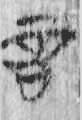言
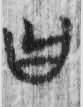曰
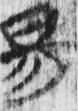昜（陽）
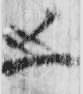之
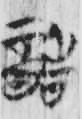酷
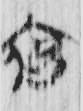倌
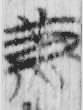黃
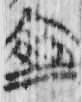齊
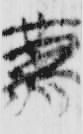黃
